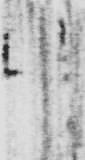戀戀
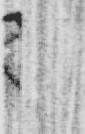也
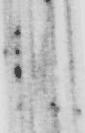也
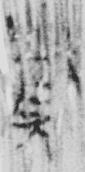○（戚）
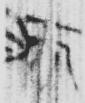肰（然）
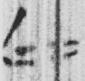㠯（以）
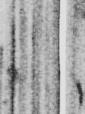夂（终）
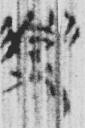○（樂）
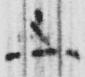之
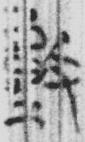○（動）
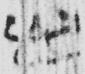心
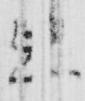也
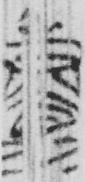濬
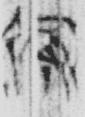深
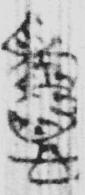慆
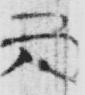亓（其）
